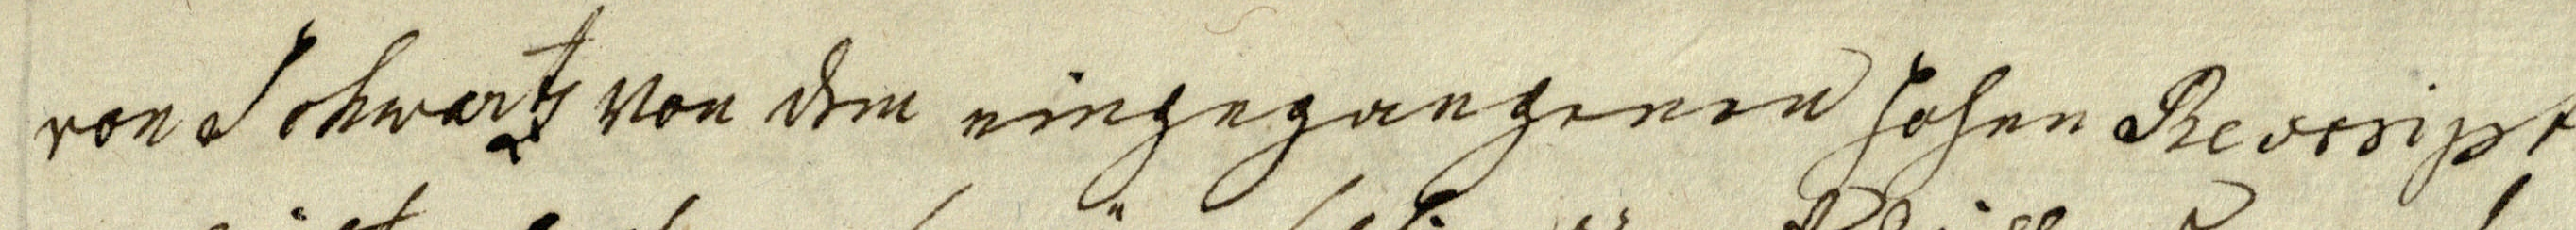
von Schwartz von dem eingegangenen hohen Rescript
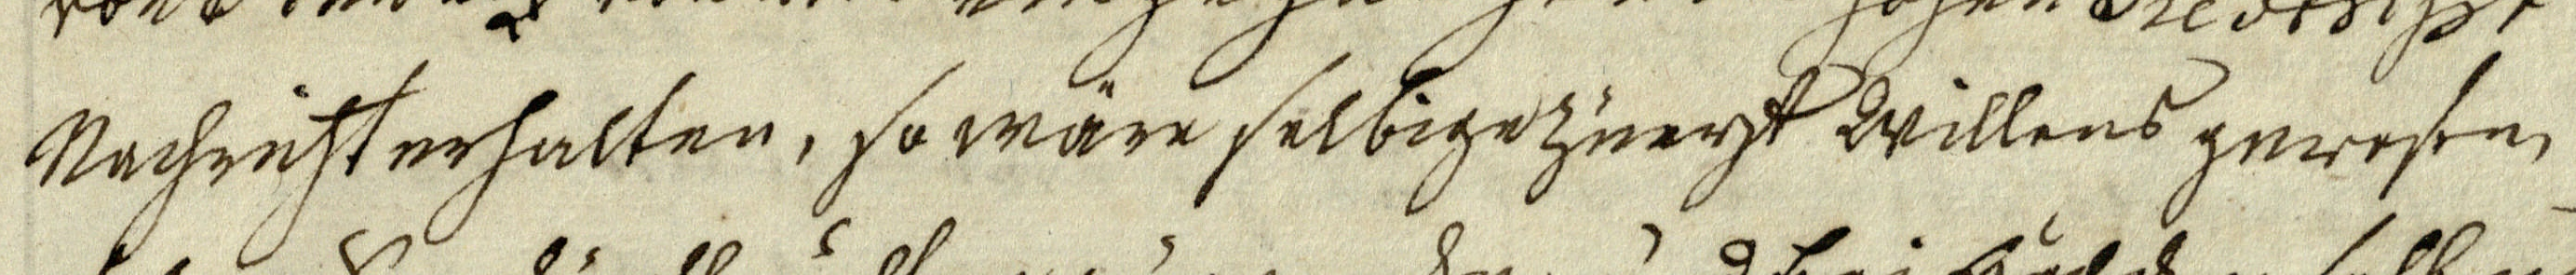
Nachricht erhalten, so wäre selbige zuerst Willens gewesen,
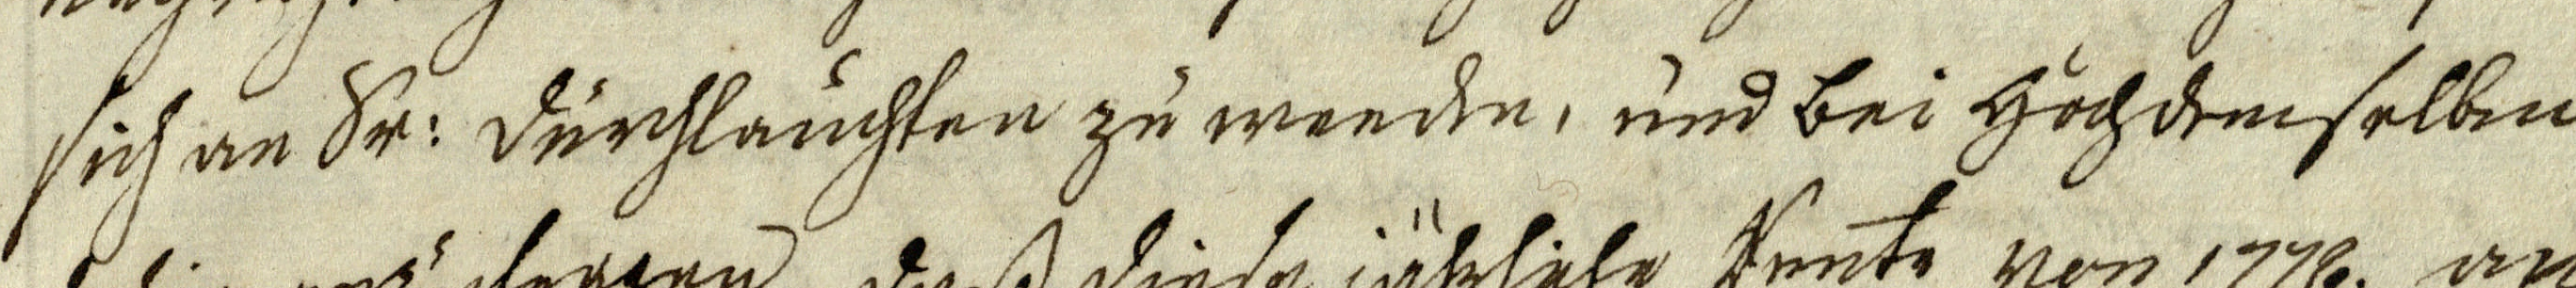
sich an Sr. Durchlauchten zu wenden, und bei Hochdemselben
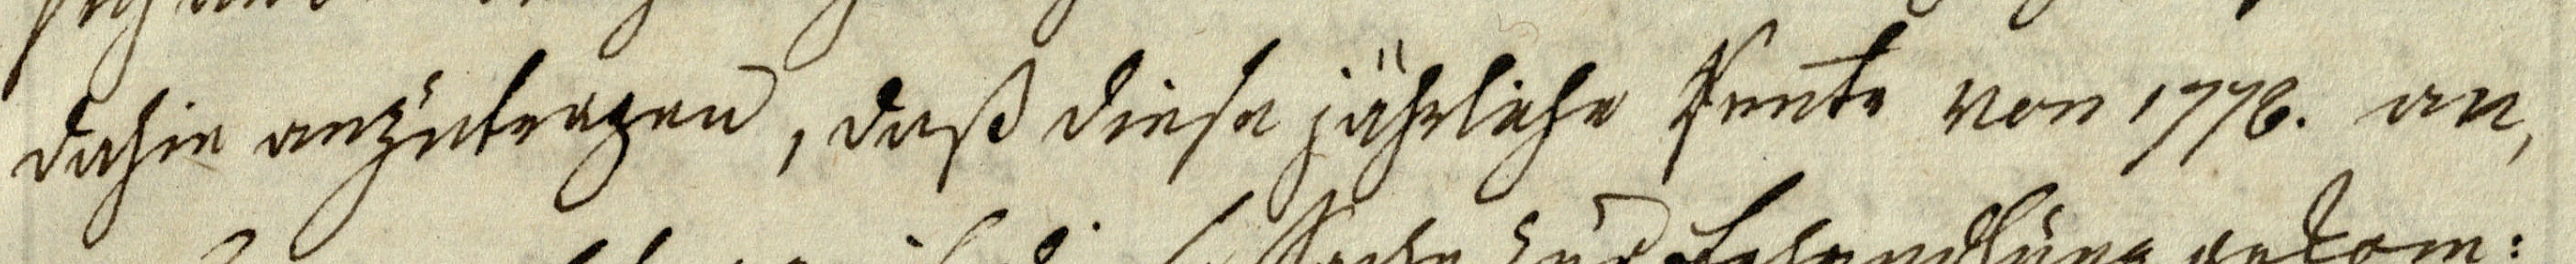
dahin anzutragen, daß diese jährliche Rente von 1778. an,
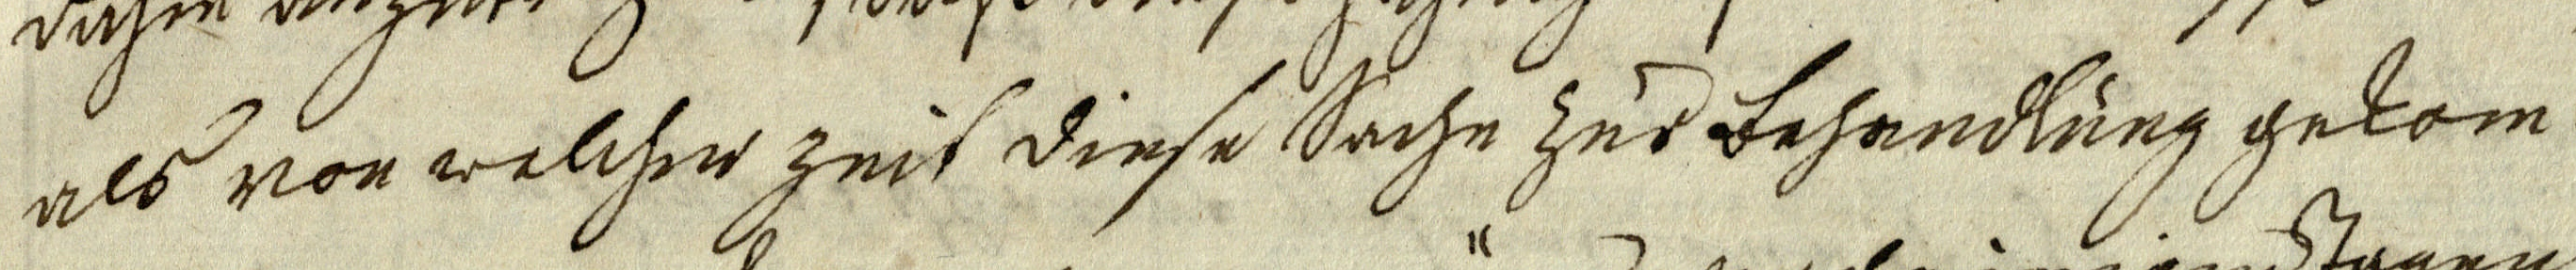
als von welcher Zeit diese Sache zur Behandlung gekom¬
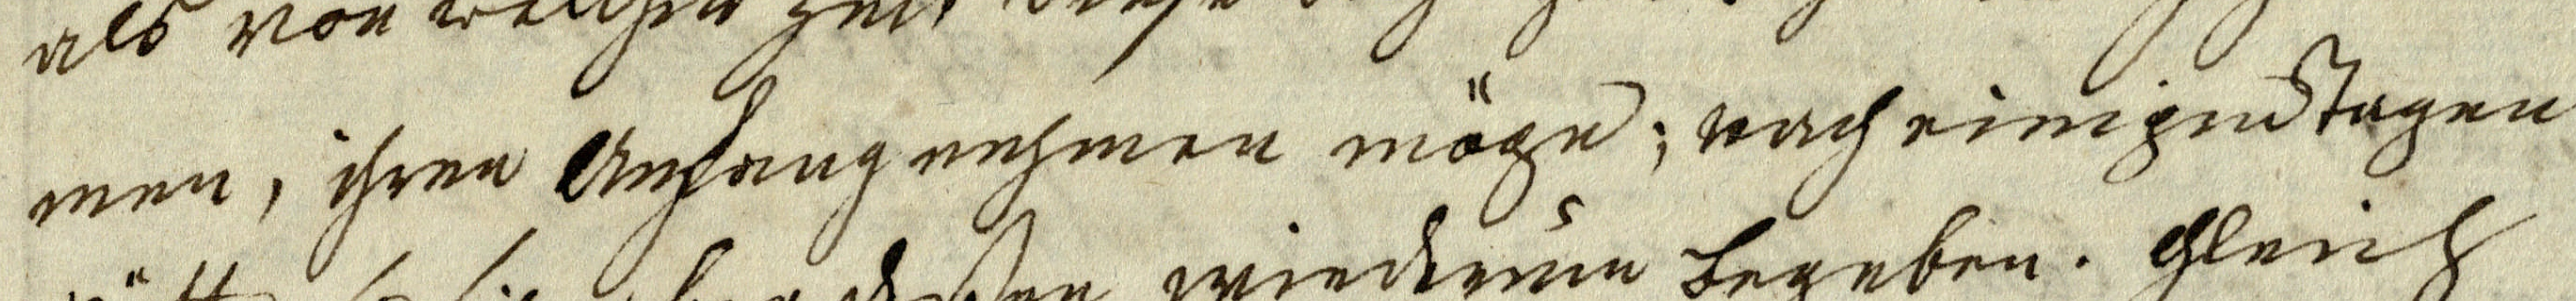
men, ihren Anfang nehmen möge; nach einigen Tagen
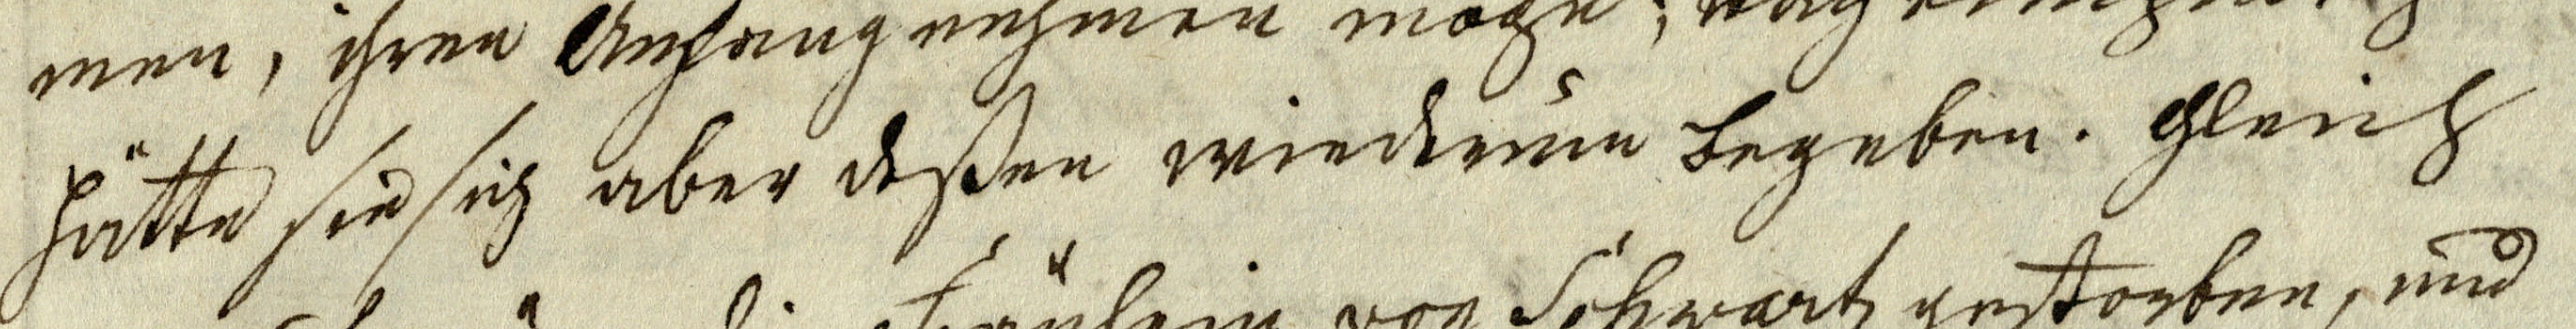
hätte Sie sich aber deßen wiederum begeben. Gleich
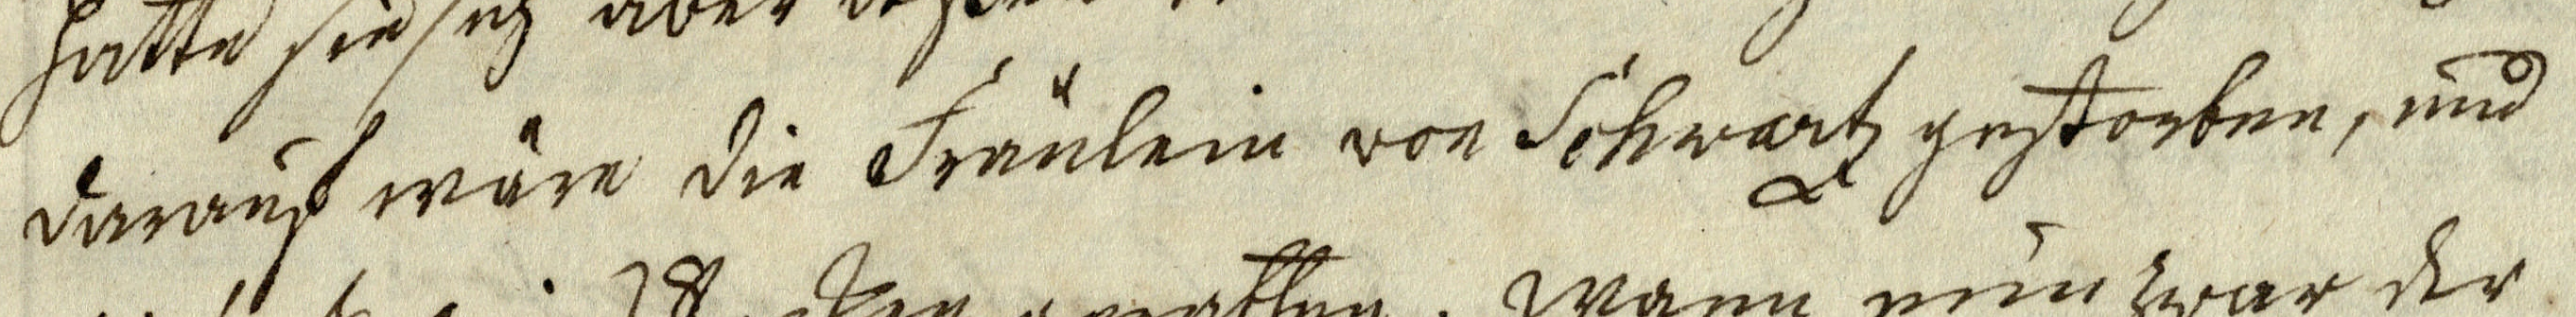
darauf wäre die Fräulein von Schwartz gestorben, und
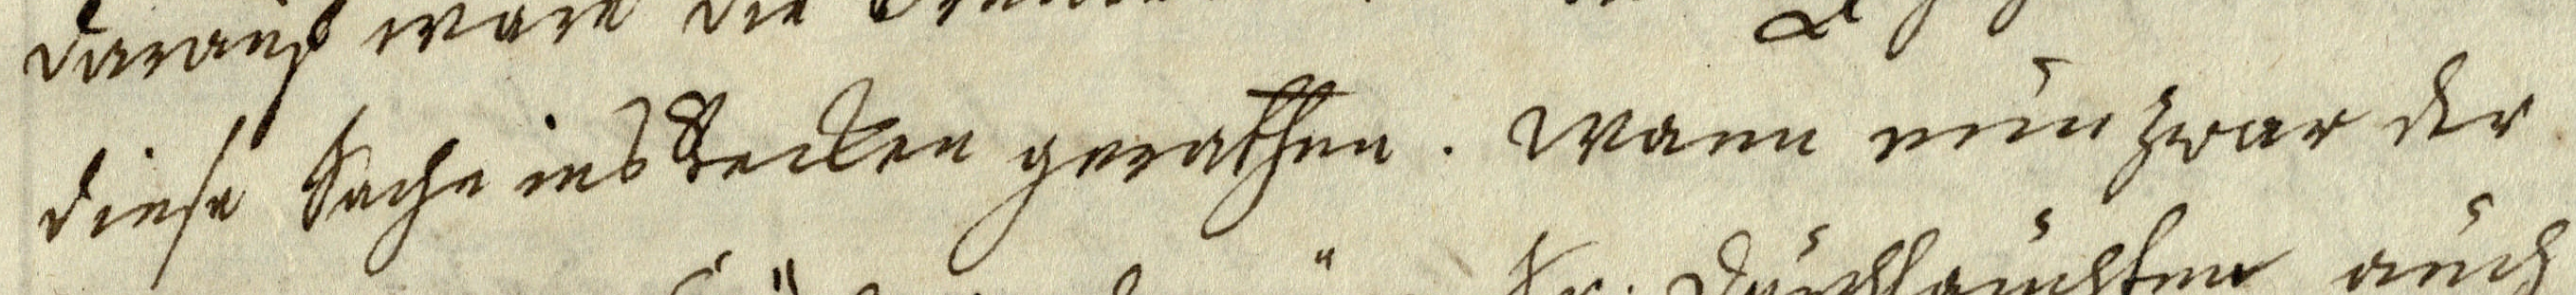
diese Sache ins Stecken gerathen. Wann nun zwar der
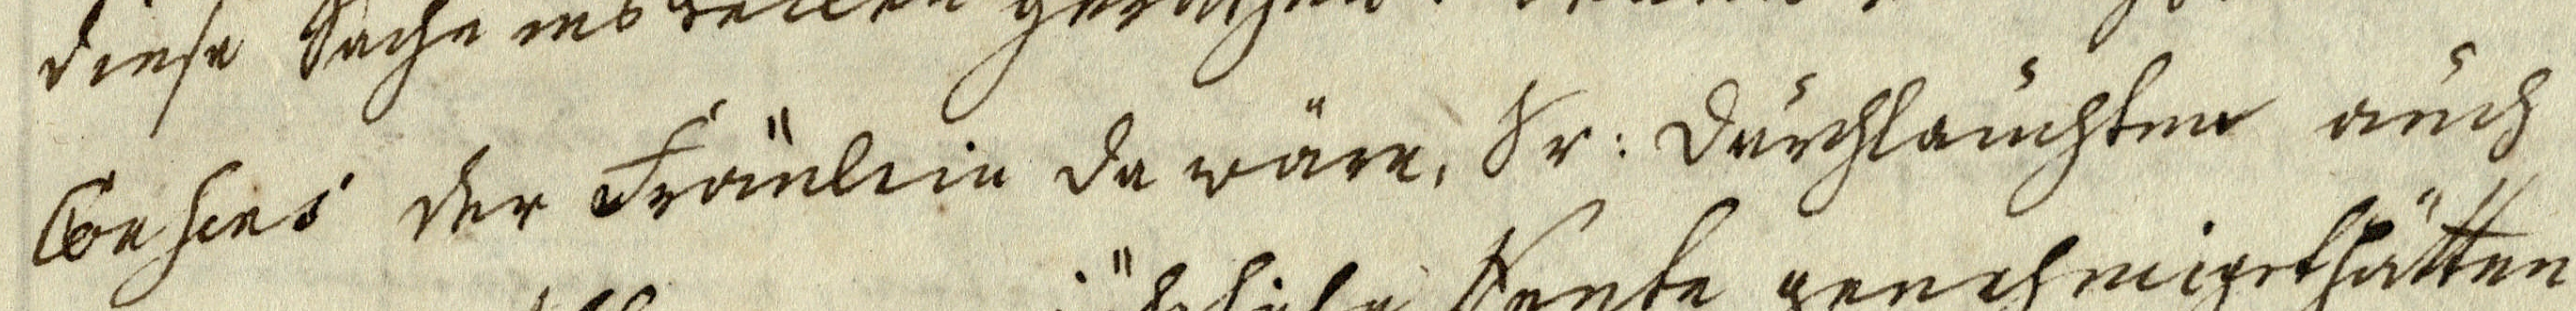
Consens der Fräulein da wäre, Sr. Durchlauchten auch
